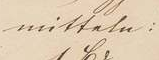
mitteln:
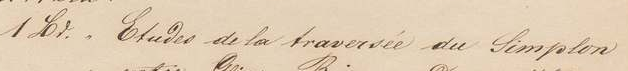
1 Bd. «Etudes de la traversée du Simplon
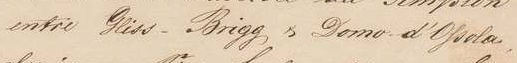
entre Gliss–Brigg & Domo-d'Ossola »
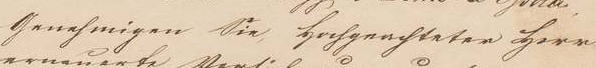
Genehmigen Sie, Hochgeachteter Herr,
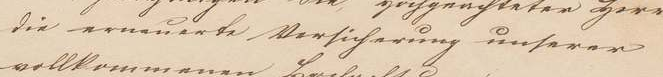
die erneuerte Versicherung unserer
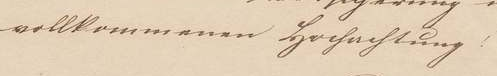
vollkommenen Hochachtung!
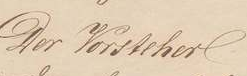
Der Vorsteher
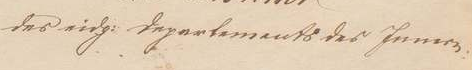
des eidg. Departements des Innern
